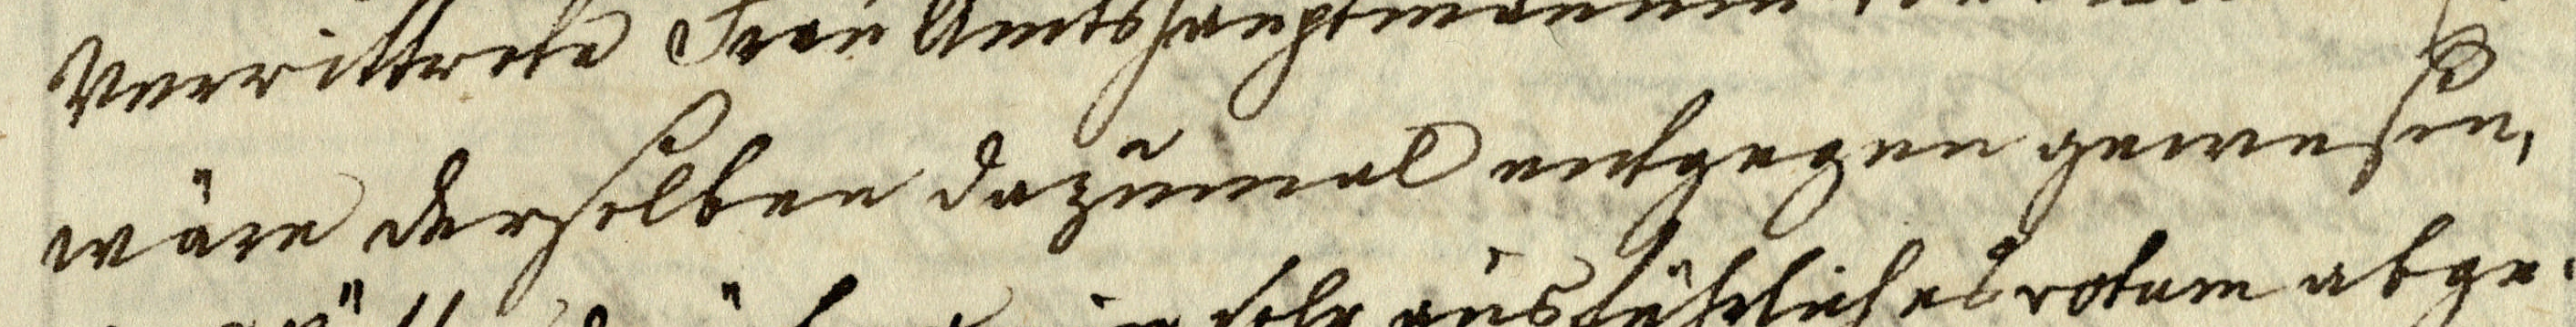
wäre derselben dazumal entgegen gewesen,
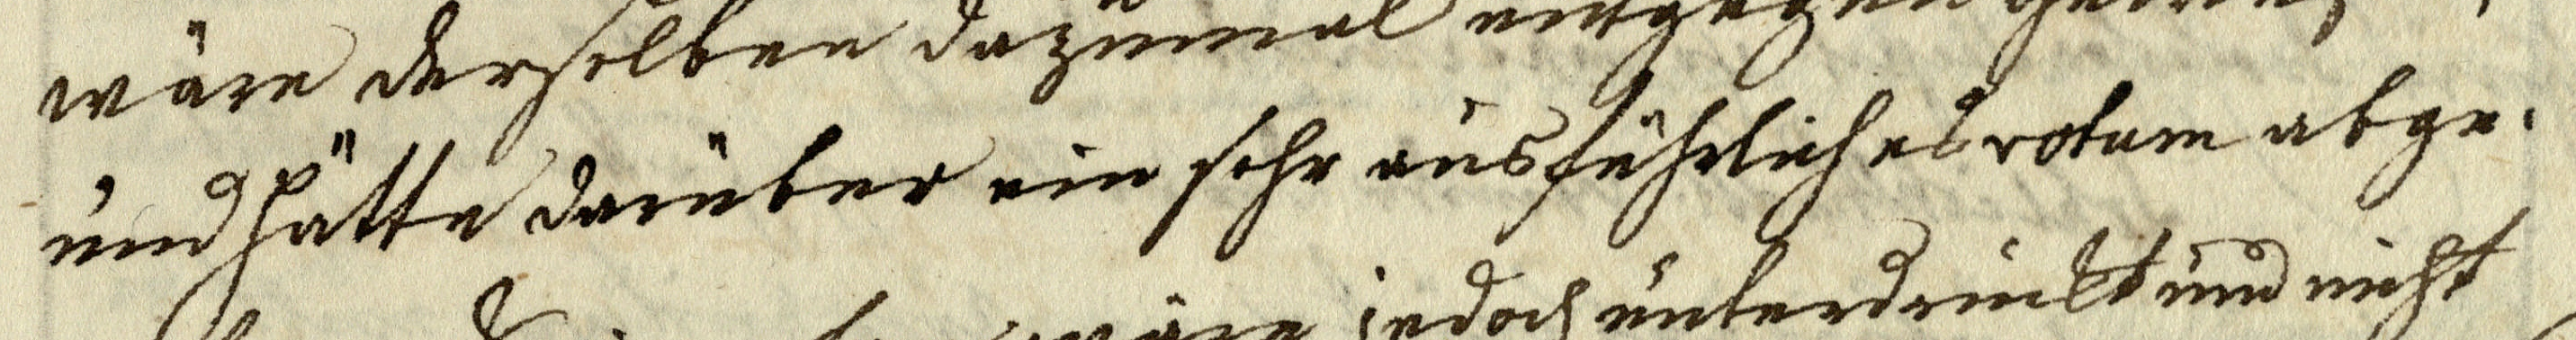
und hätte darüber ein sehr ausführliches votum abge¬
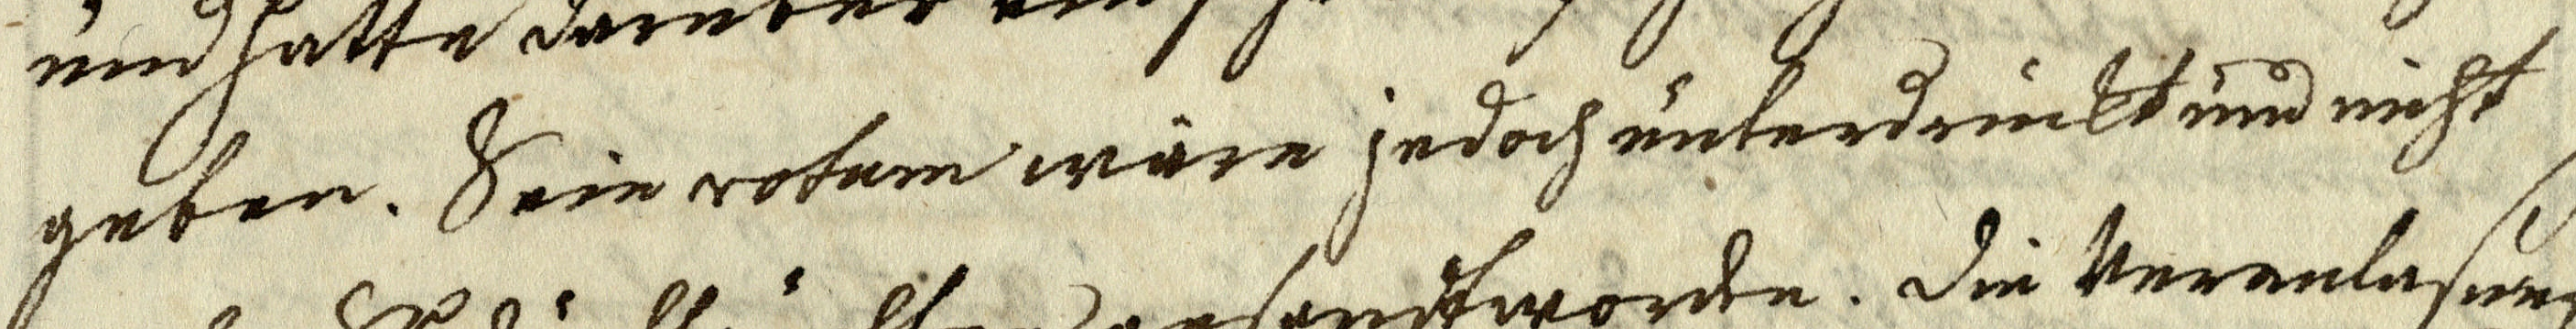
geben. Sein votum wäre jedoch unterdrückt und nicht
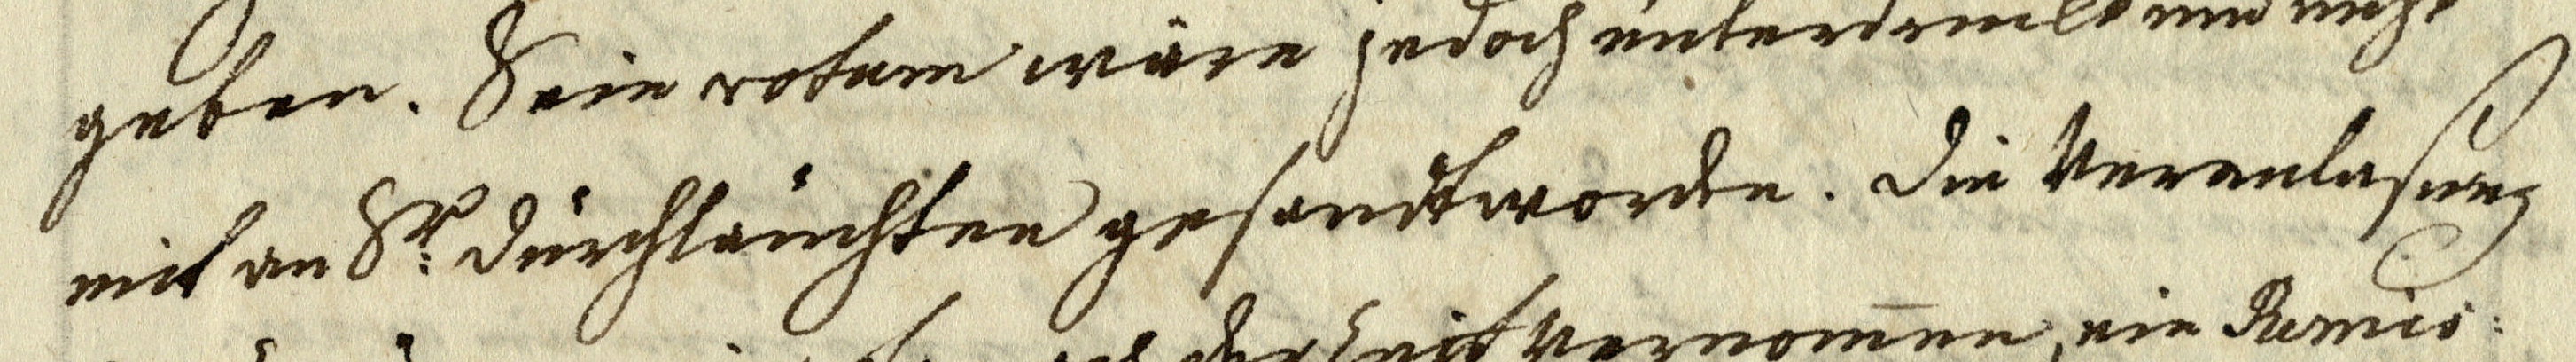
mit an Sr Durchlauchten gesandtworden. Die Veranlaßung
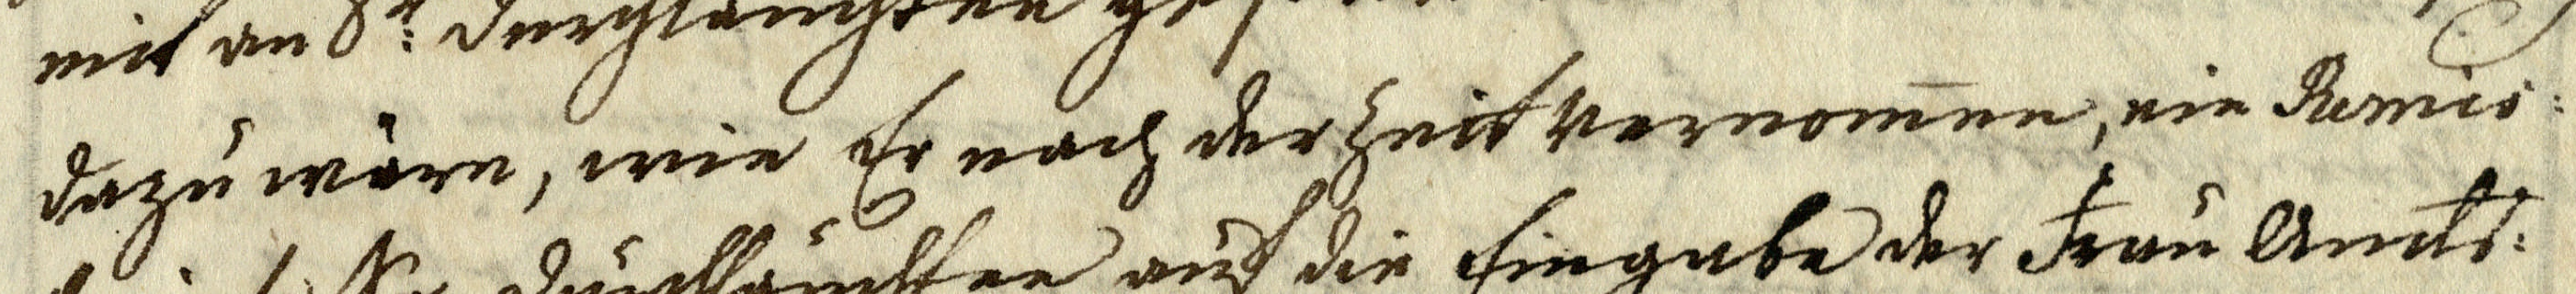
dazu wäre, wie Er nach der Zeit vernommen, ein Remis¬
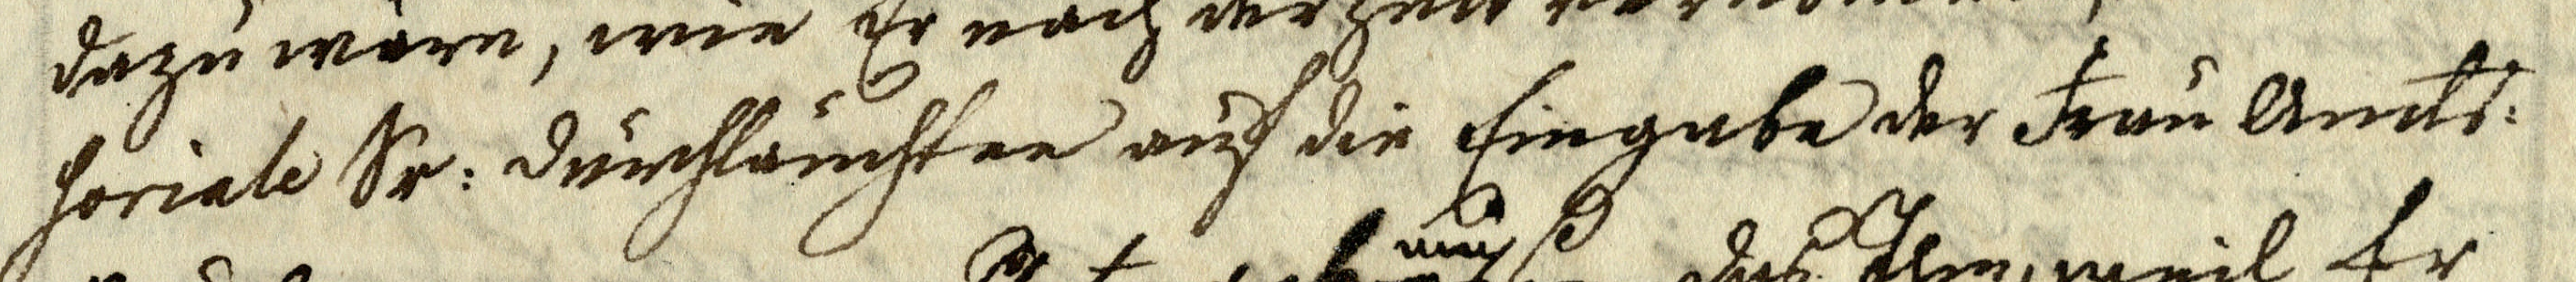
soriale Sr. Durchlauchten auf die Eingabe der Frau Amts¬
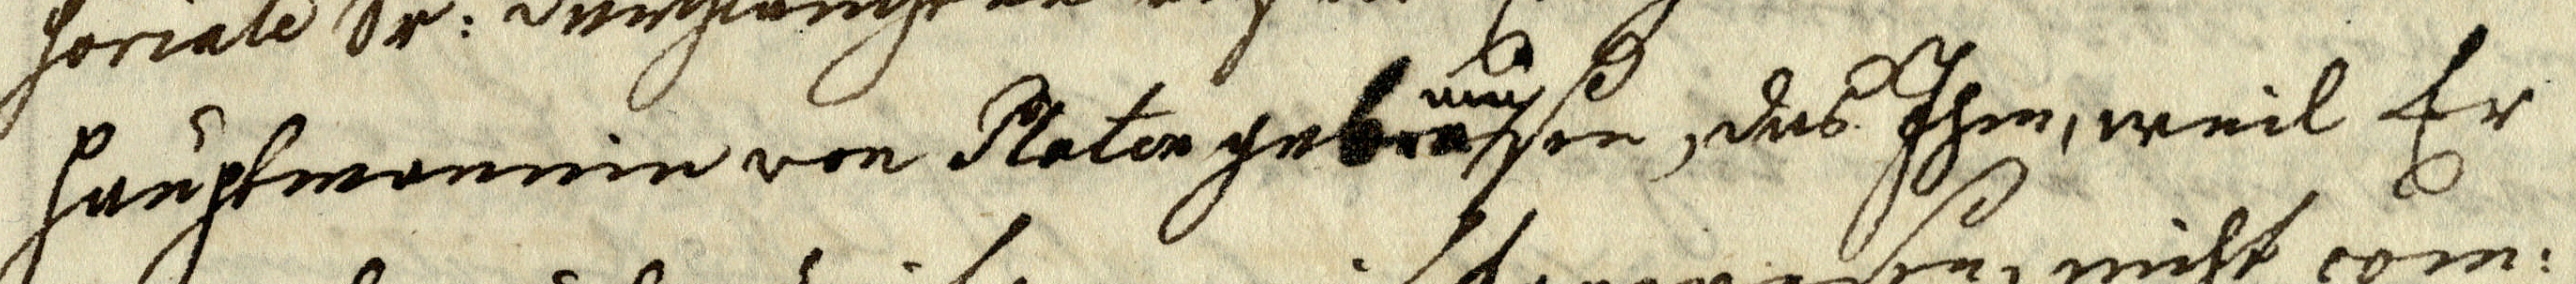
hauptmannin von Platen gebrassen, das Ihm, weil Er
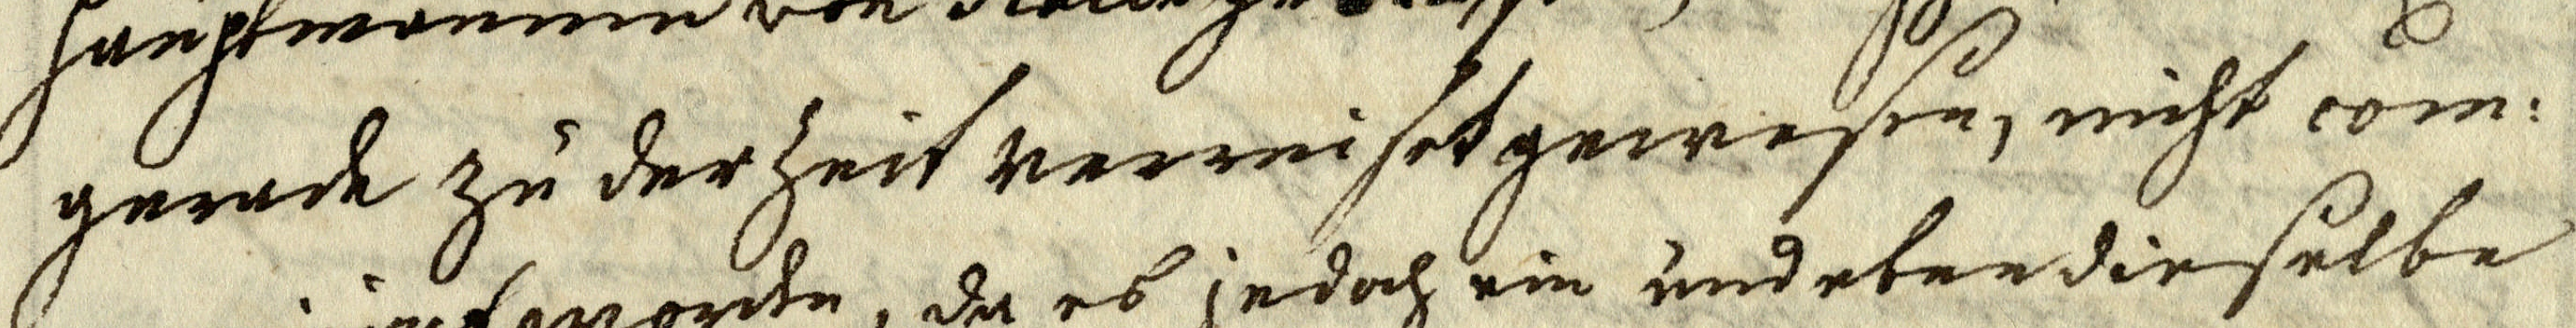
gerade zu der Zeit verreiset gewesen, nicht com¬
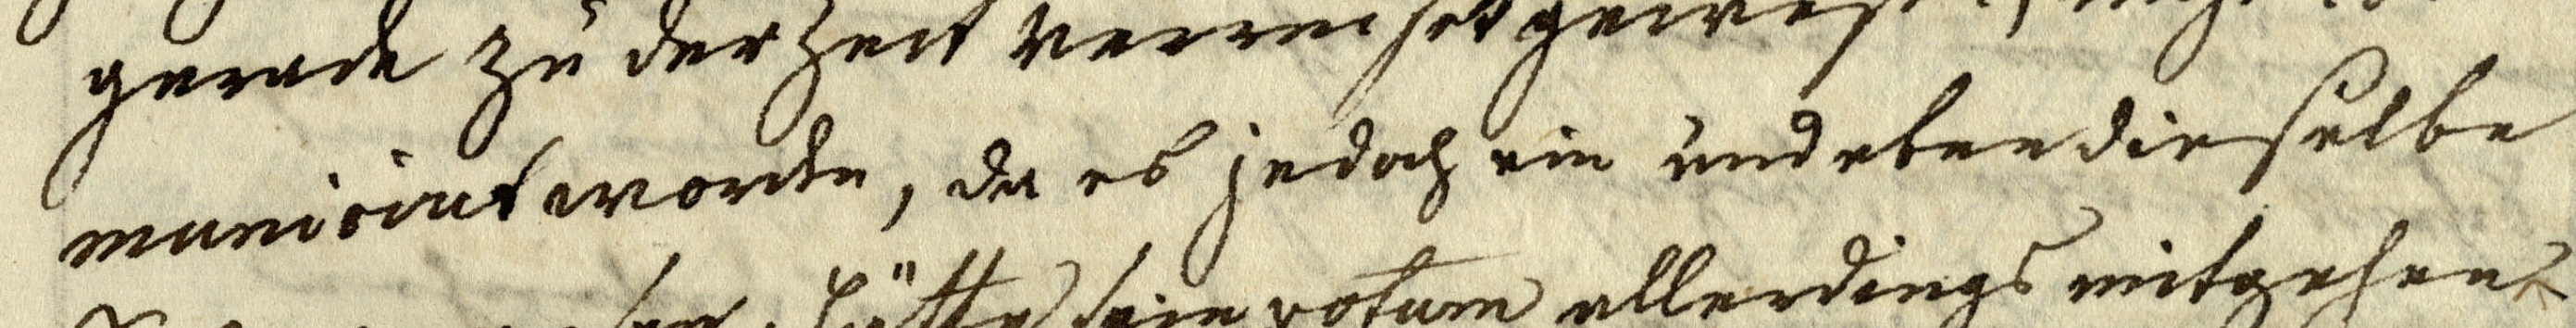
municiret worden, da es jedoch ein und eben dieselbe
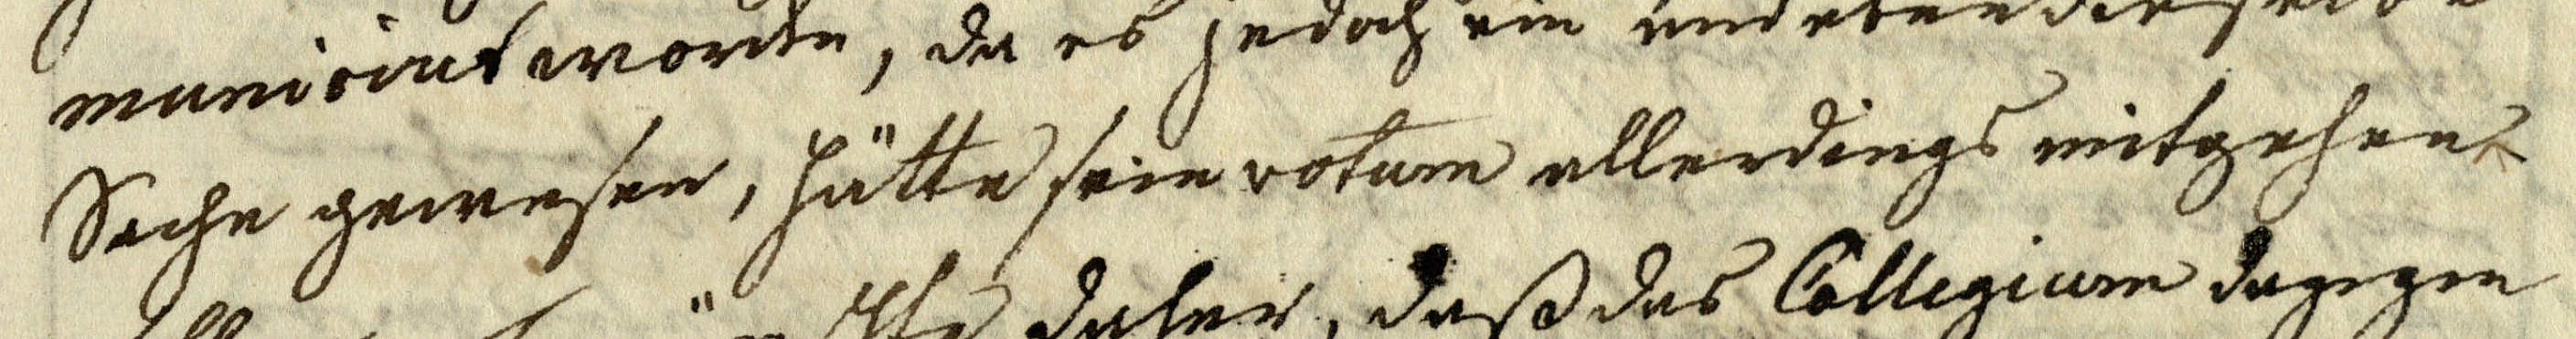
Sache gewesen, hätte sein votum allerdings mitgehen
